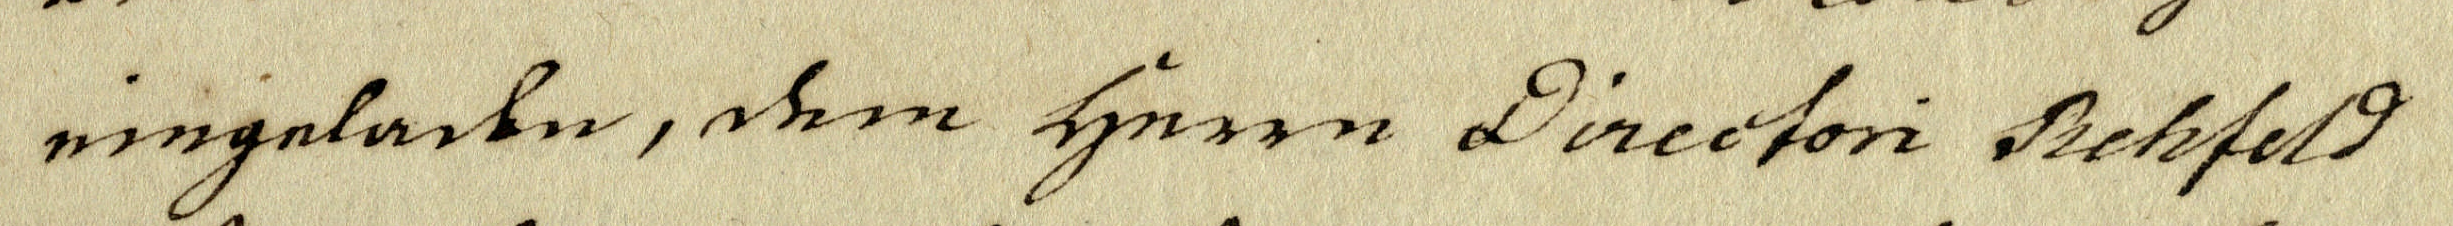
eingeladen, dem Herrn Directori Rehfeld
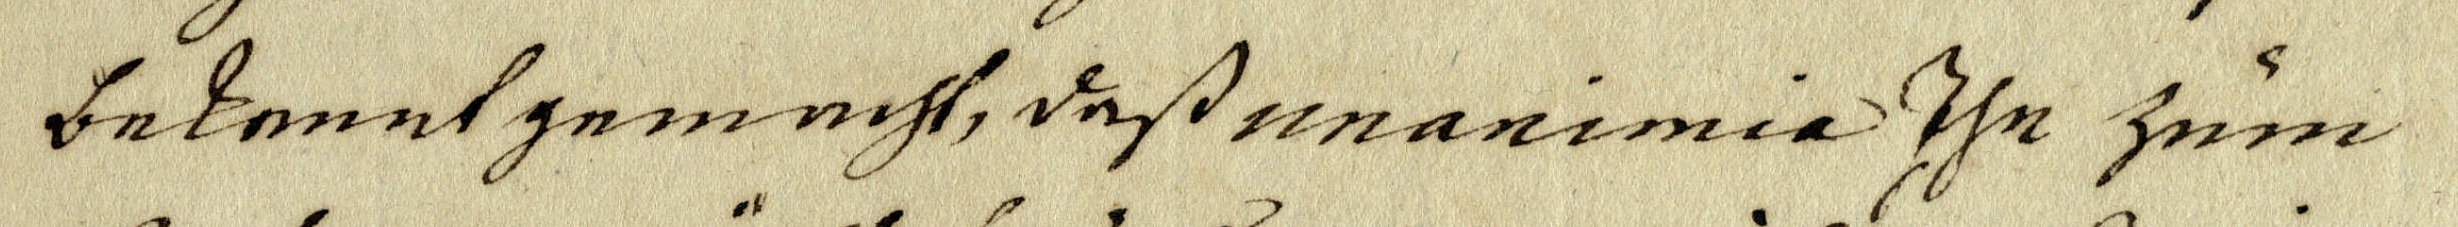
bekannt gemacht, daß unanimia Ihn zum
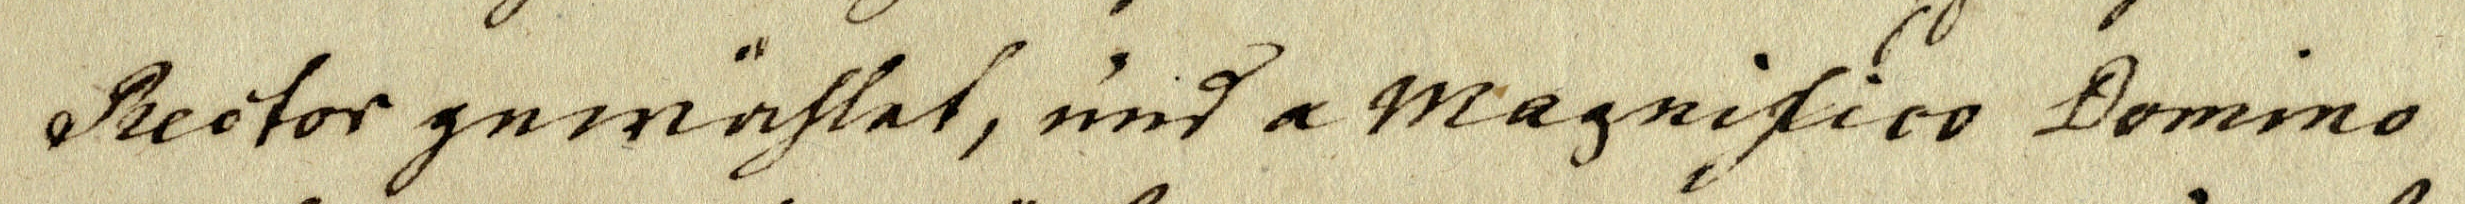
Rector gewählet, und a Magnifico Domino
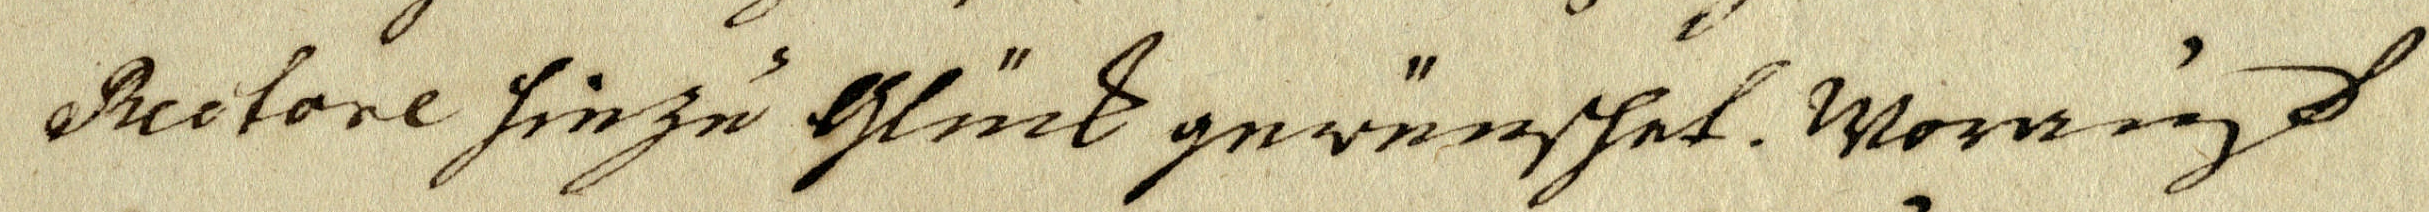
Rectore hiezu Glück gewünschet. Worauf
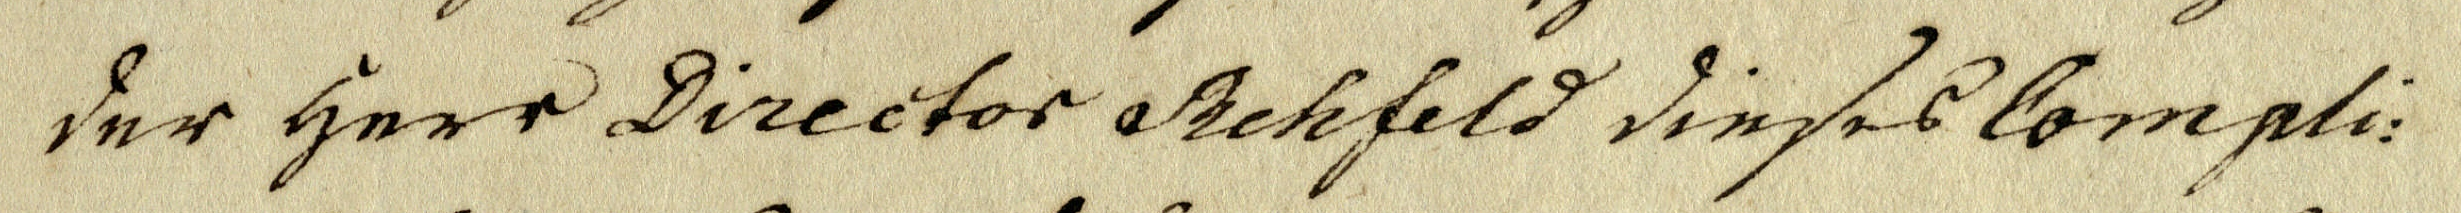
der Herr Director Rehfeld dieses Compli¬
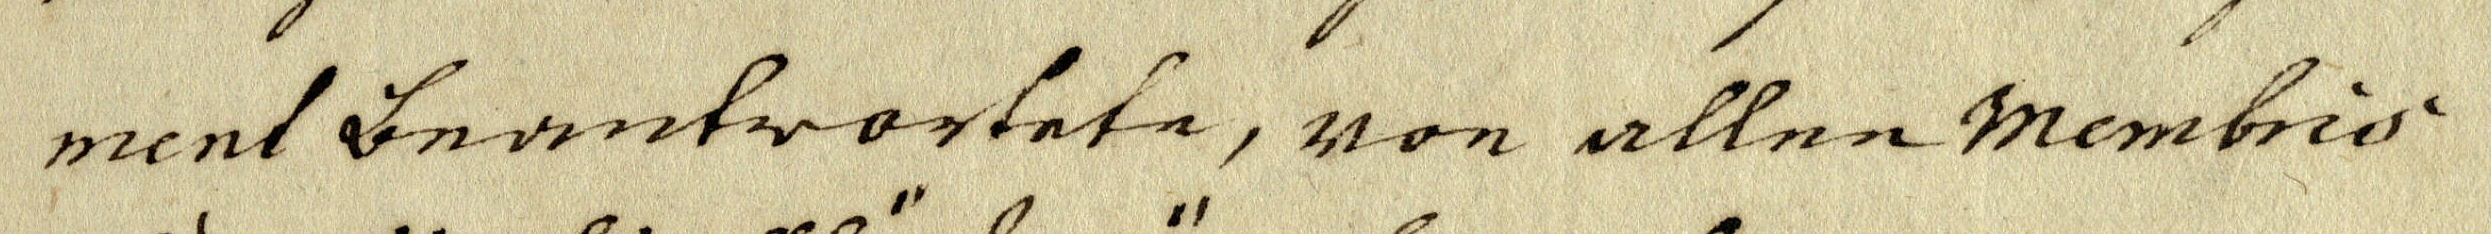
ment beantwortete, von allen Membris
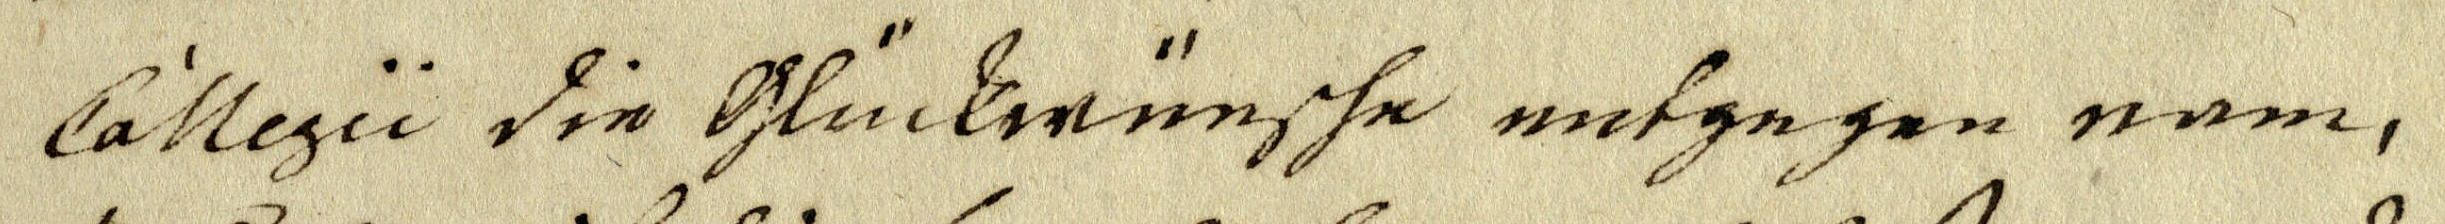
Collegii die Glückwünsche entgegen nam,
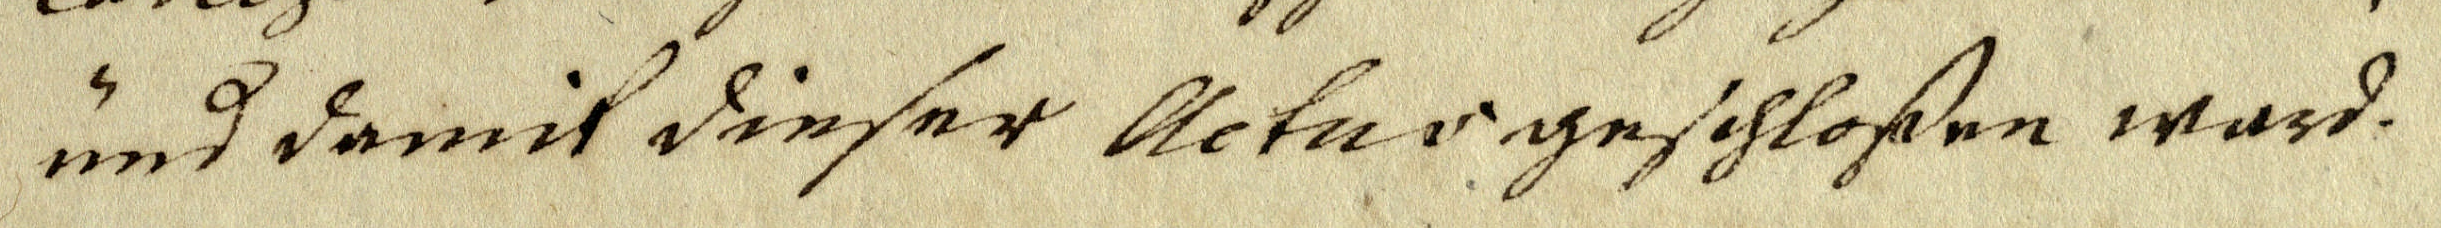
und damit dieser Actus geschloßen ward.
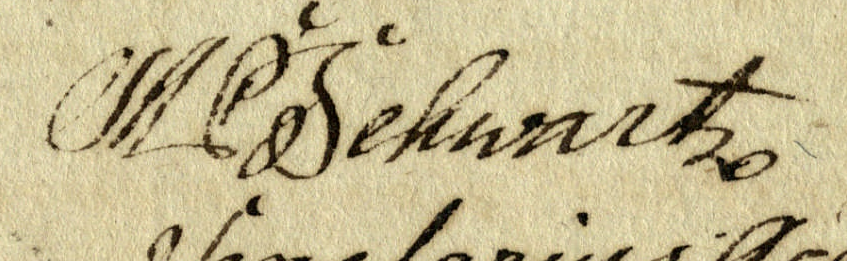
M C Schwartz
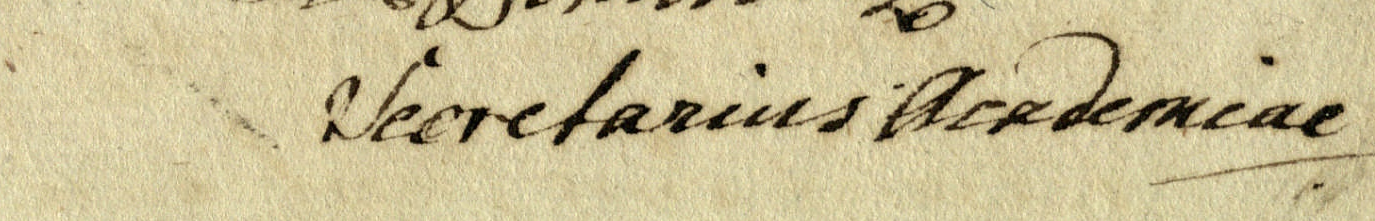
Secretarius Academiae
